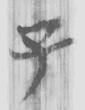子
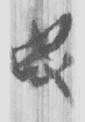奴
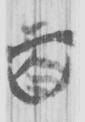百
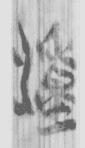湩
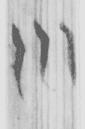川
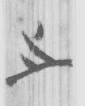之
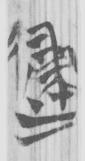歸
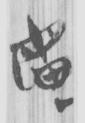{母田}
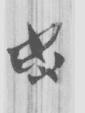奴
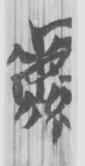{每糸}
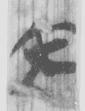內
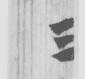三
